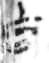吉
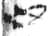女
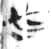必
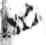出
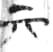亓（其）
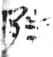邦
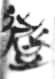逃
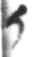人
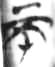不
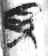○（得）
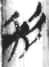利（利）
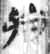於
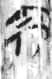○（寇）
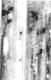逃（盜）
